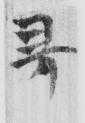𡵂
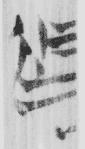{辶殳}
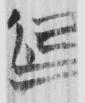起
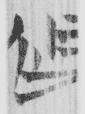{辶殳}
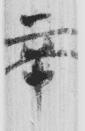不
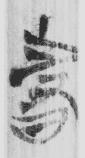時
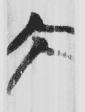大
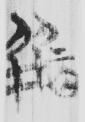弼
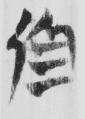於
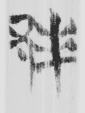邦
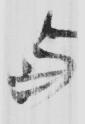此
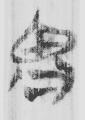胃
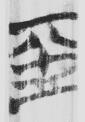亞
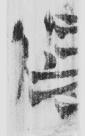{辶殳}
